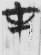才（在）
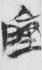○（陳）
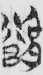○（豫）
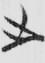之
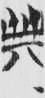典
